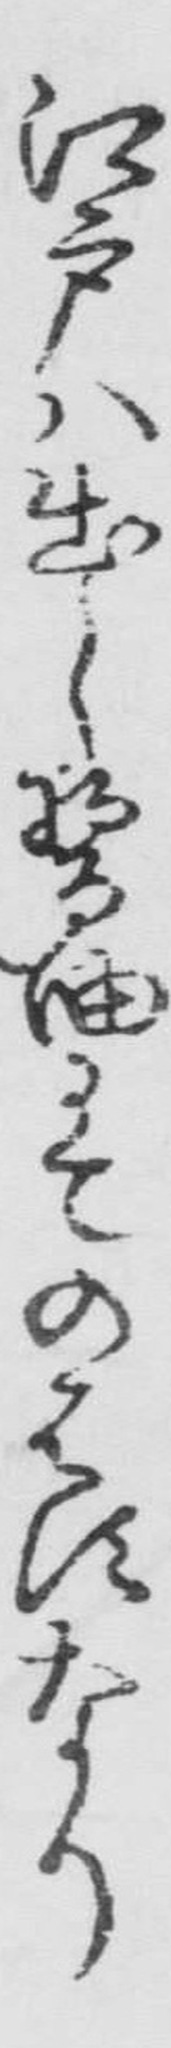江戸は出し醤油にてのはすなり
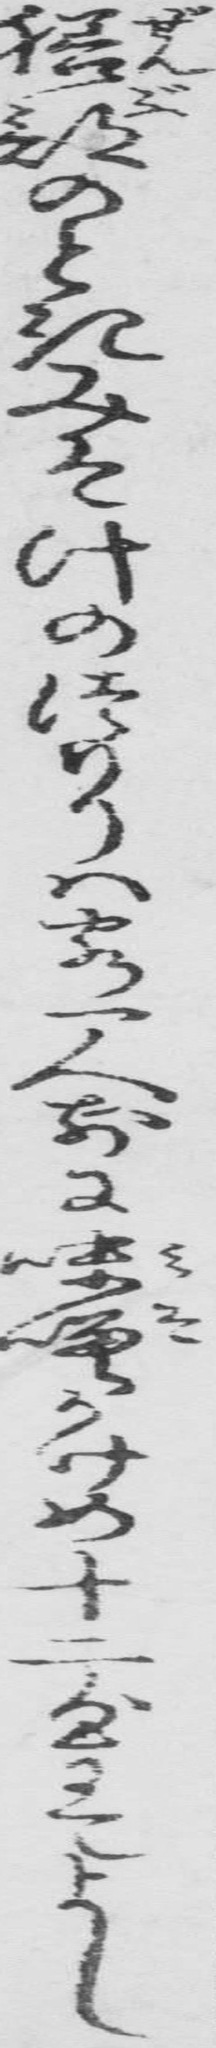膳部のときみそ汁のつもりは客一人前に味噌かけめ十二にてよし
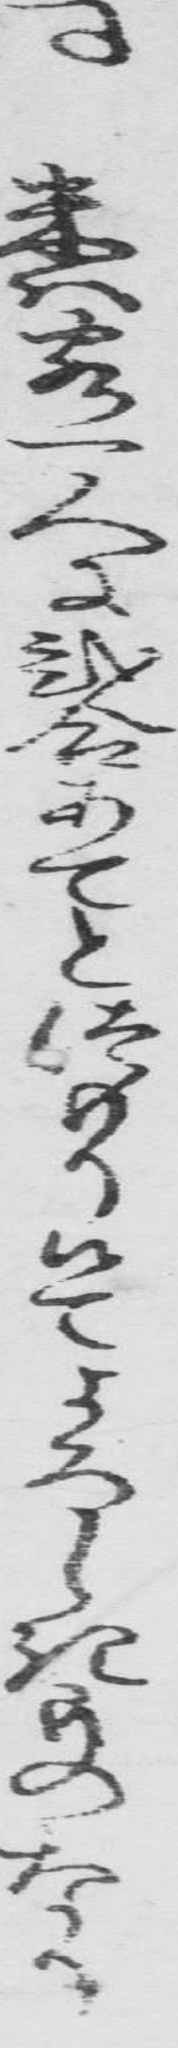同米は客一人に弐合あてとつもり候てよろしきものなり

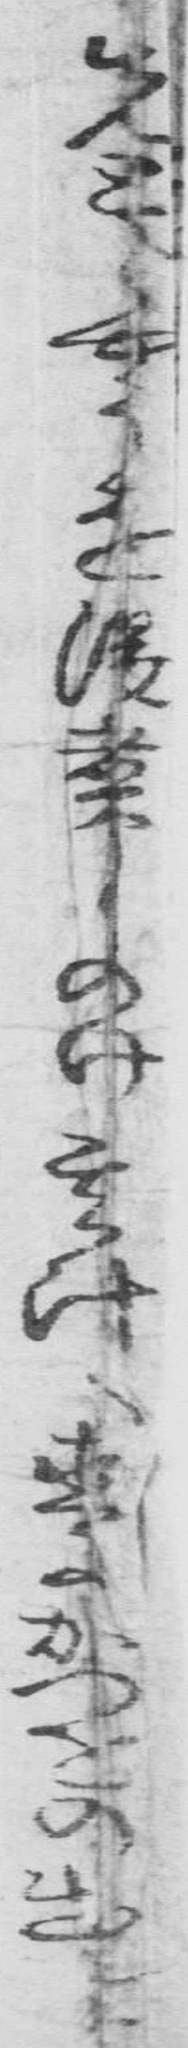先どじやうを湯煮しのけ其汁へ直にかつをの出し
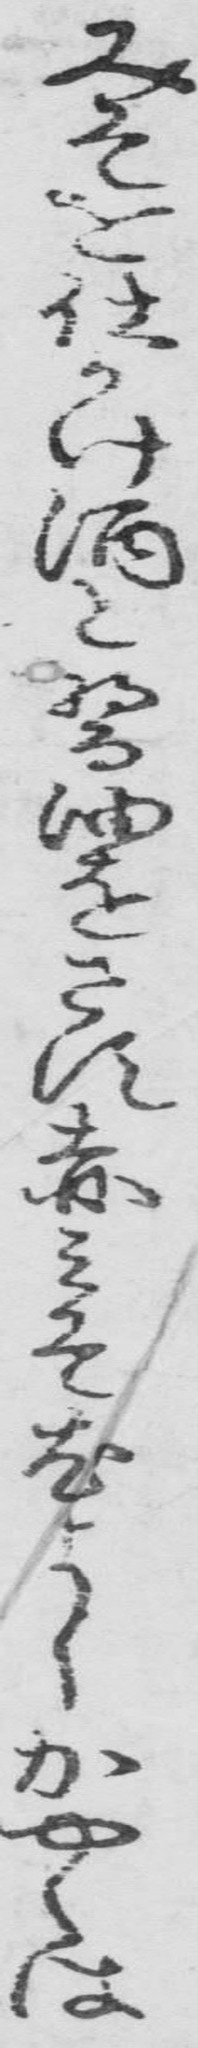みそを仕かけ酒と醤油をさす赤みそ尤よしかやくは
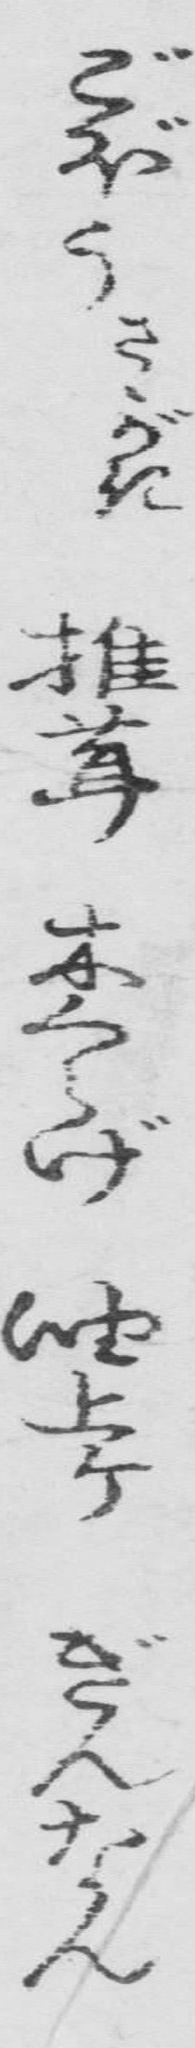ごぼうささがき椎茸木くらげ油上けぎんなん
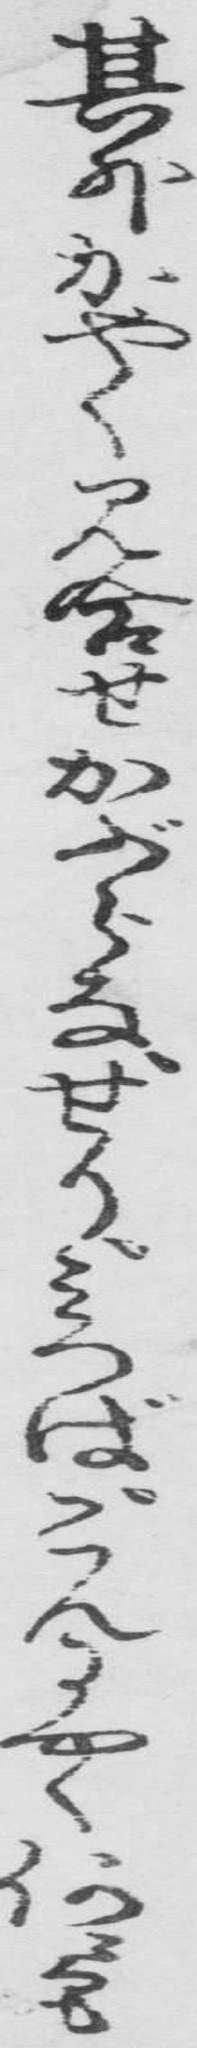其外かやく身合せかぶらな、せり、みつば、こんにやく何にても
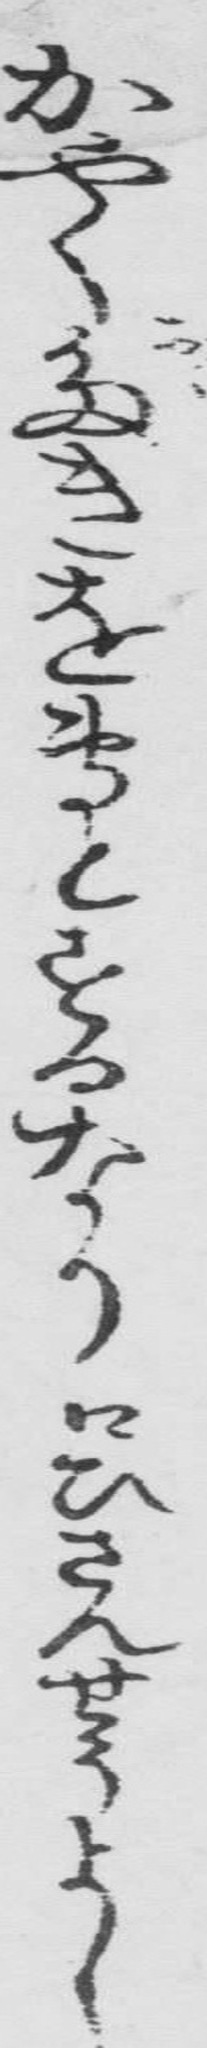かやく多きを専らとするなり口ひさんせうよし
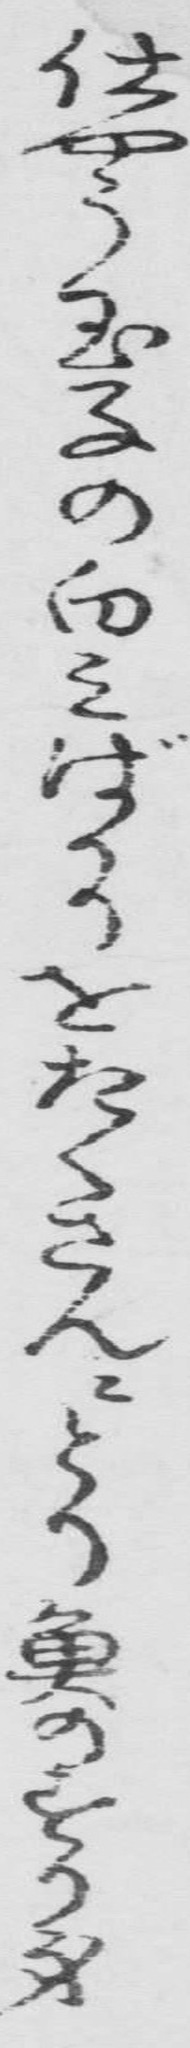淡雪玉子仕やう玉子の白身ばかりをたくさんにとり魚のすり身
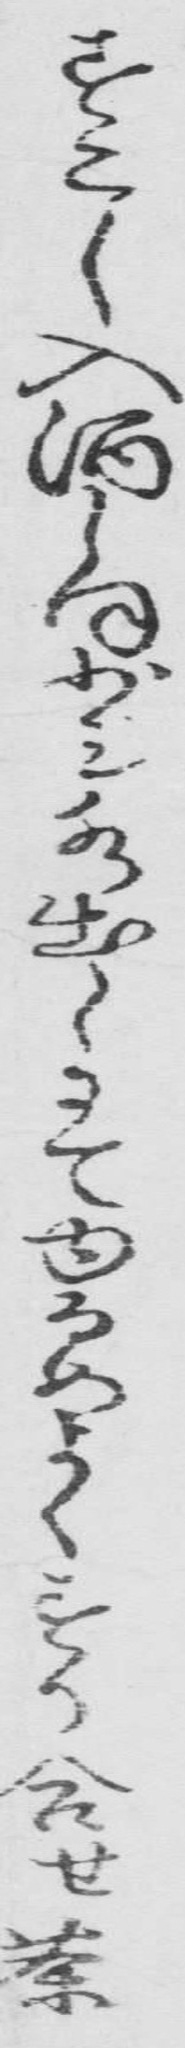すこし入酒しほ少し水出しにてゆるめよくすり合せ茶
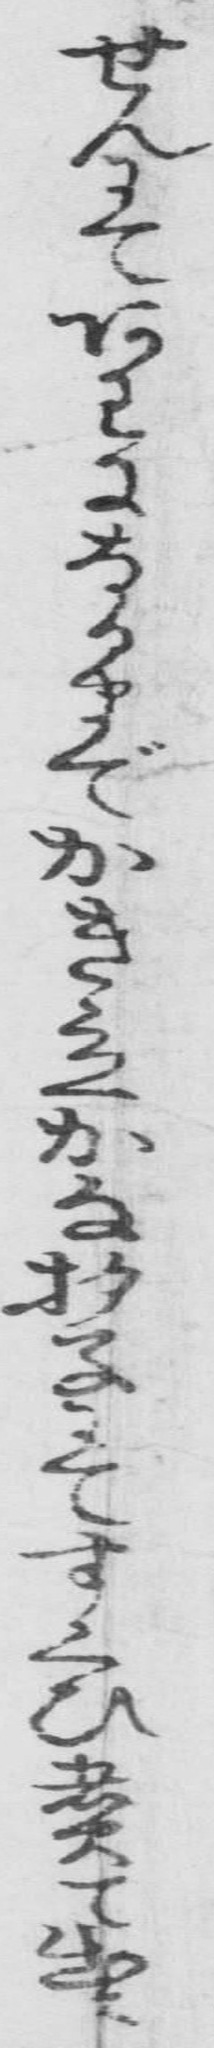せんにてあわになるまでかき立かな杓子にてすくひ煮て出す
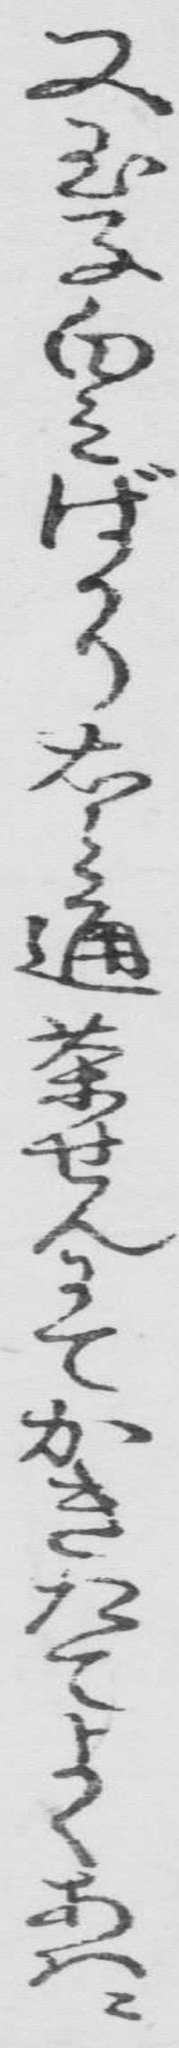又玉子白みばかり右之通茶せんにてかきたてよくあはに
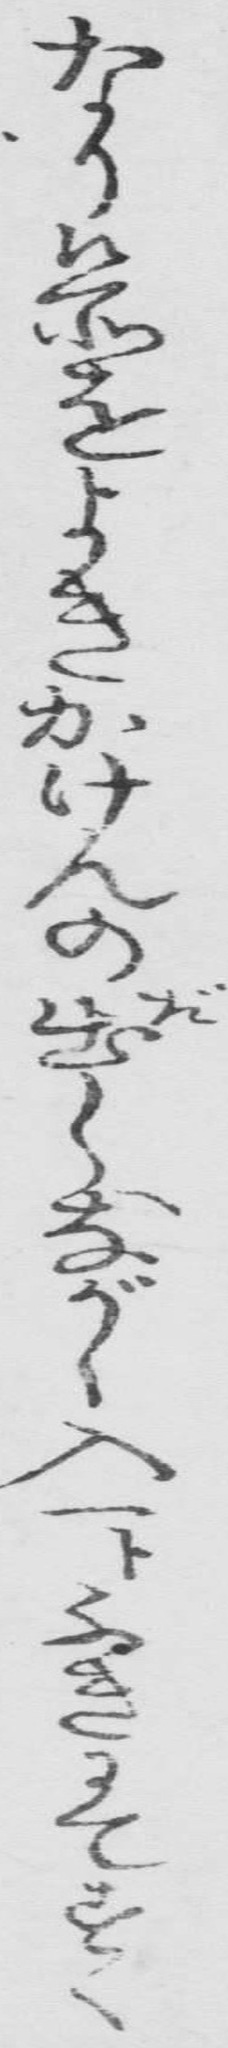なり候所をよきかけんの出しながし入一とふきにてすく
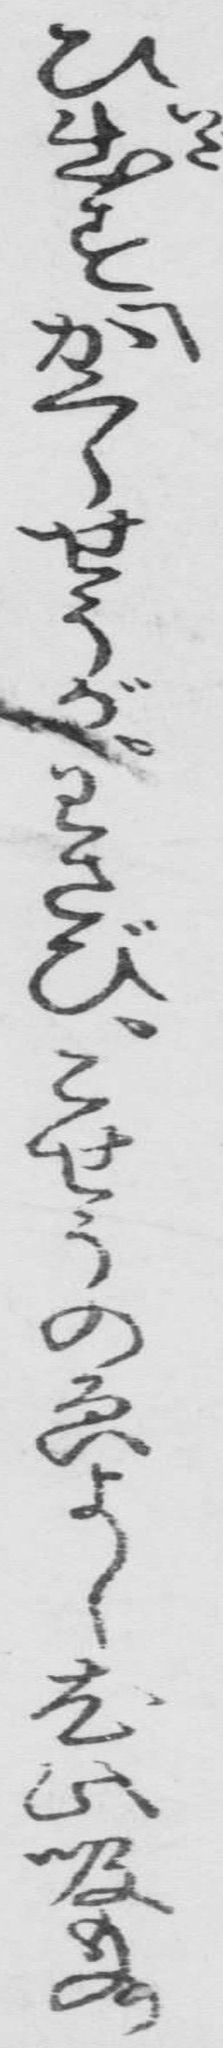ひ出す〽かくしせうが、わさび、こせうのるいよし尤此吸もの
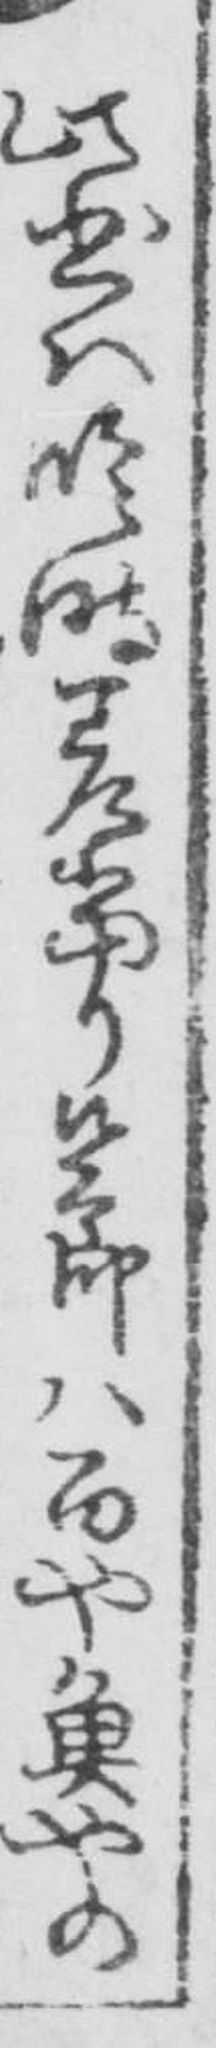此書は臨時差当り節八百や魚やの
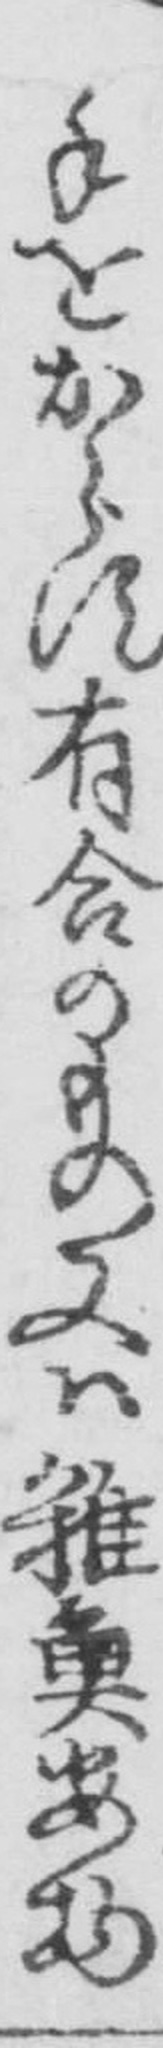手をからす有合のもの又は雑魚安物
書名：諸家通用/即席料理
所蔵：大阪府立大学学術情報センター 国文学研究資料館
